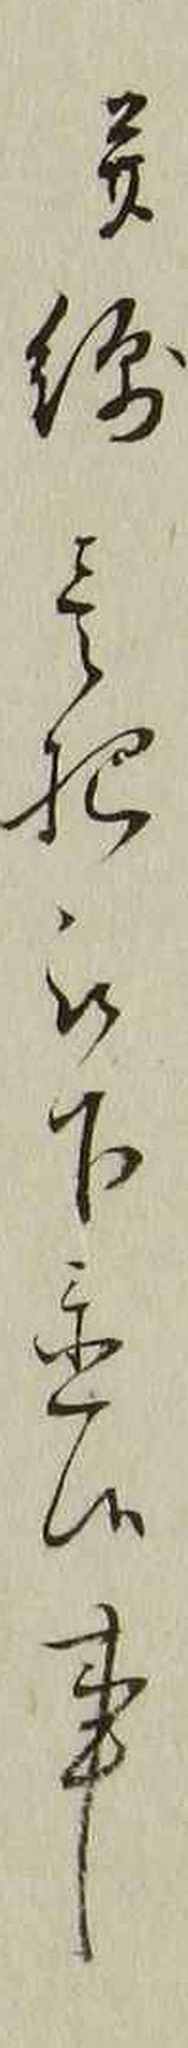并綿壱把被下置候事
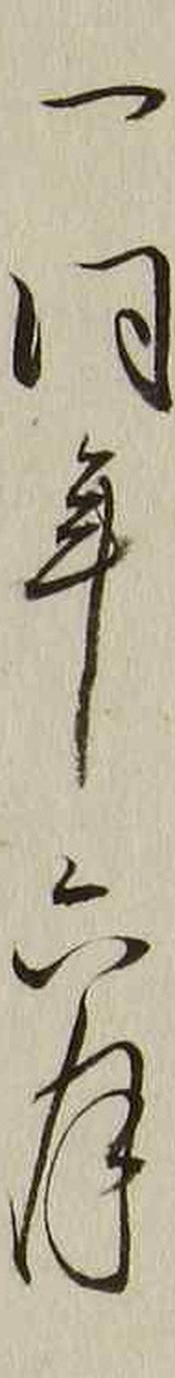一同年六月
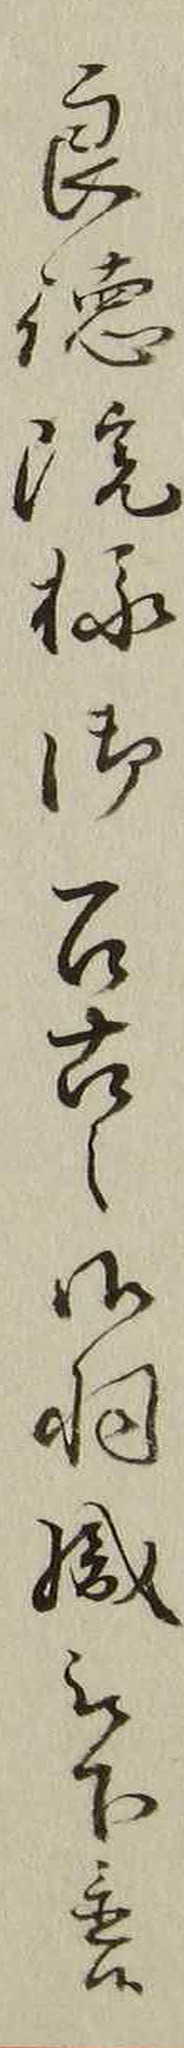良徳院様御召古之御羽織被下置候
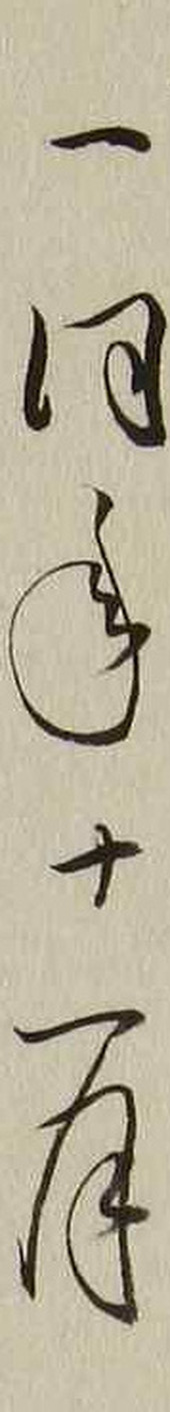一同年十一月
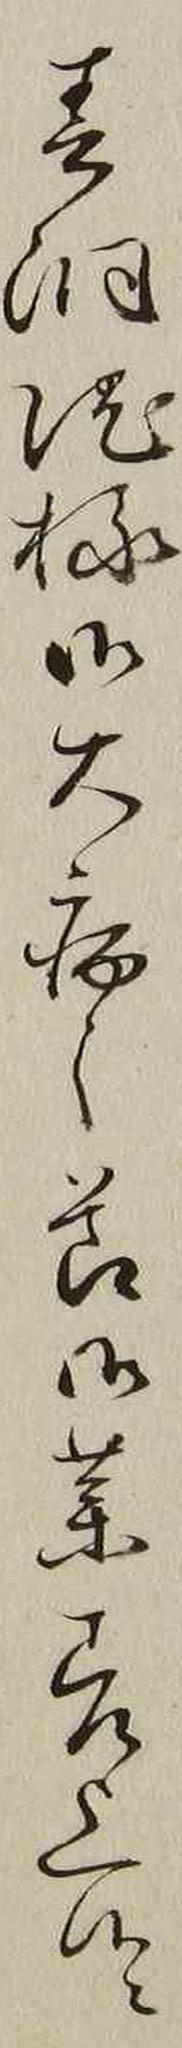春洞院様御大病之節御薬差上候ニ
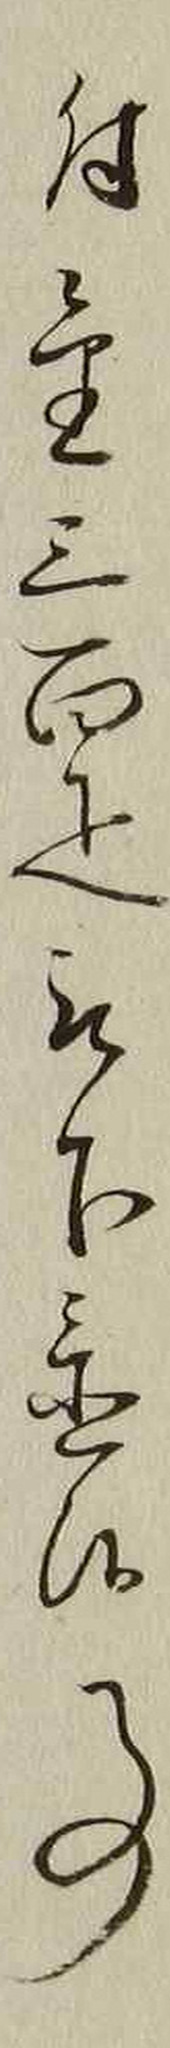付金三百疋被下置候事
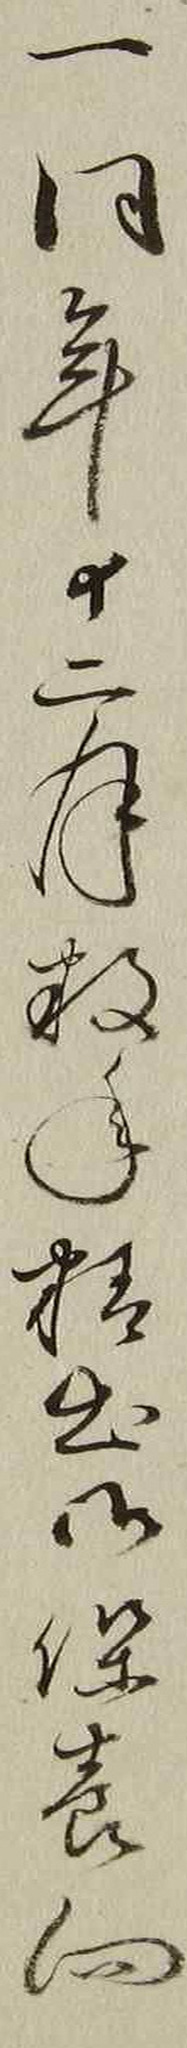一同年十二月数年精出御保養向
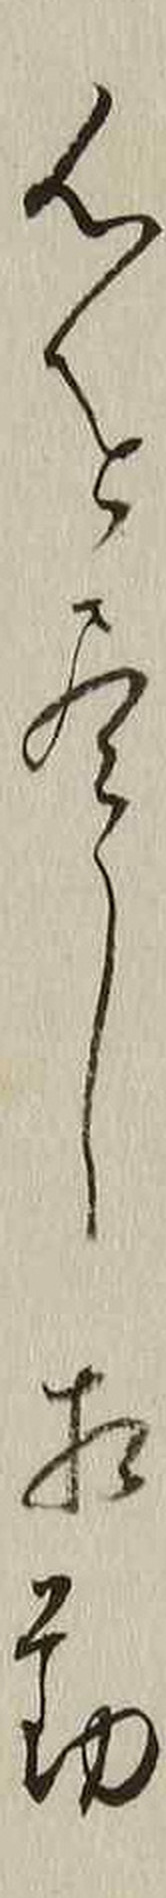心を尽し相勤
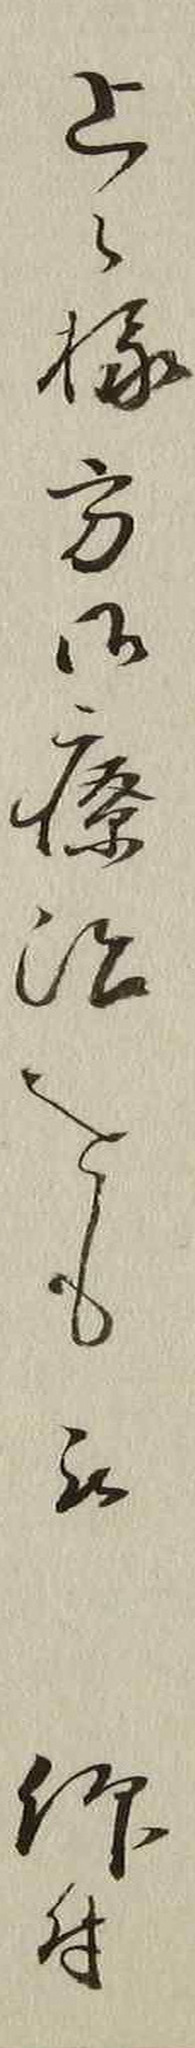上々様方御療治をも被仰付
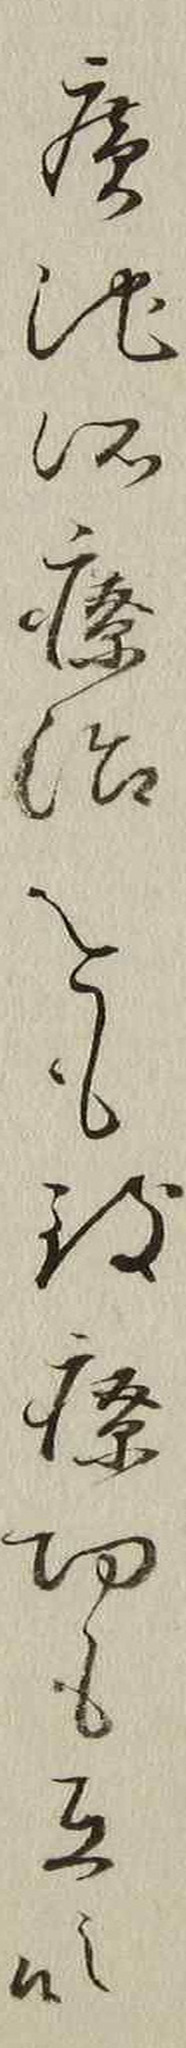広他所療治をも致療切も在之候
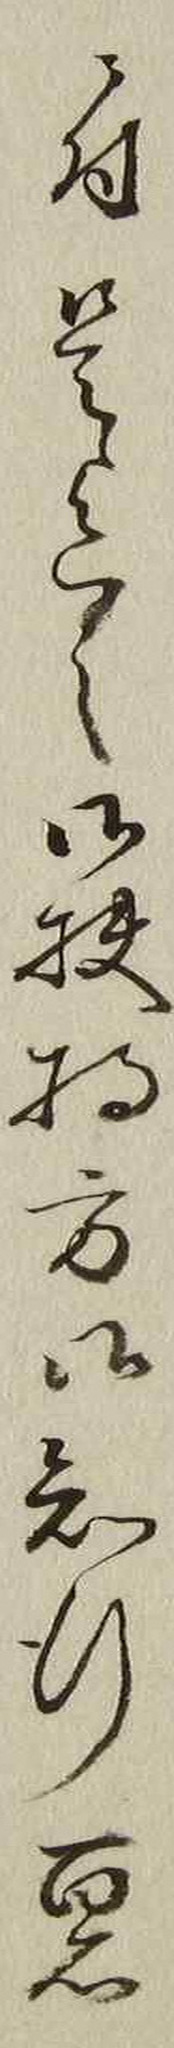ニ付是迄之御扶持方御知行百石
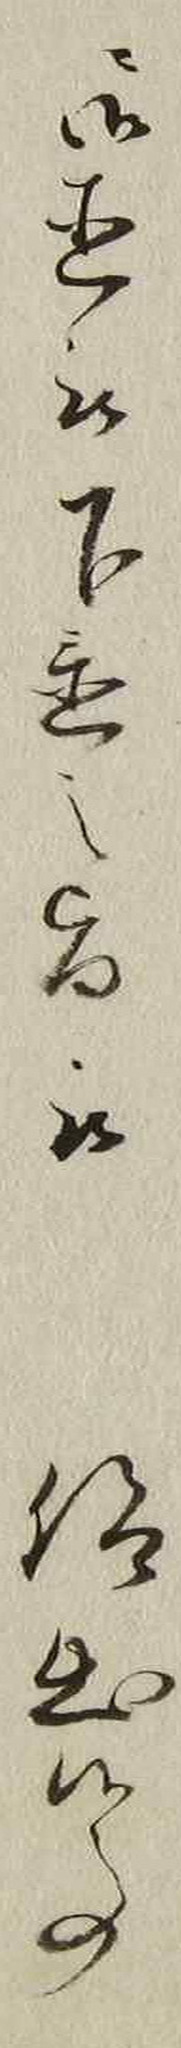ニ御直被下置之旨被仰出候事
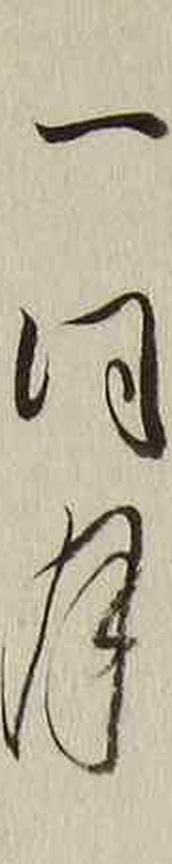一同月
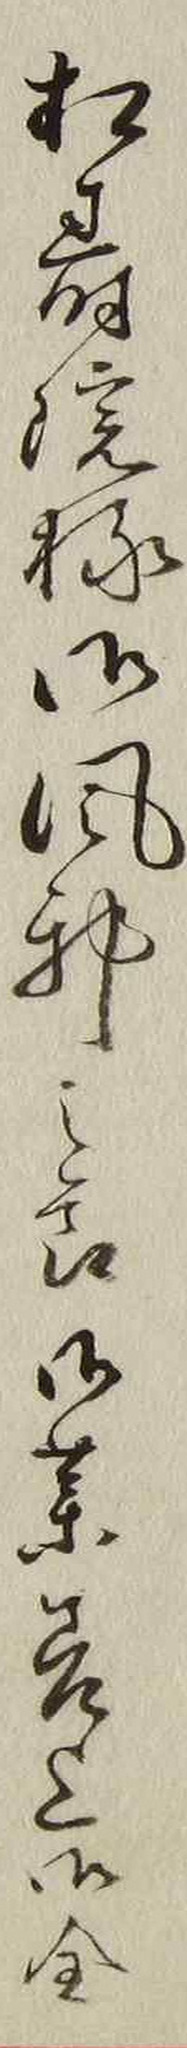松寿院様御風邪之節御薬差上御全
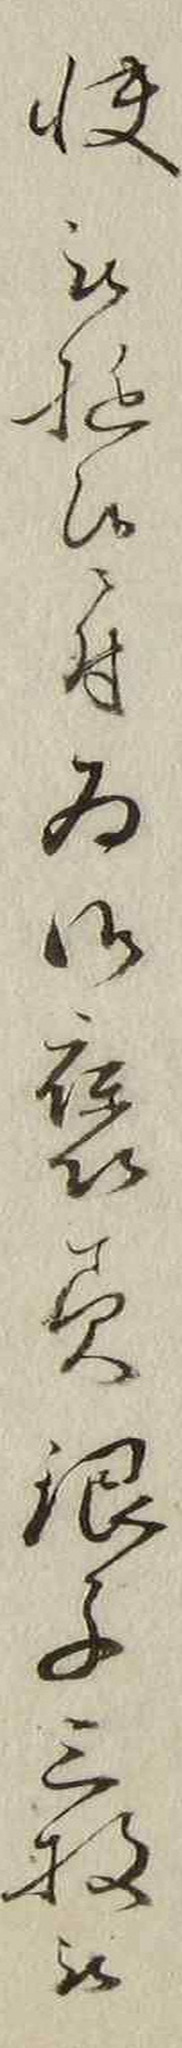快被遊候ニ付為御褒美銀子三枚被
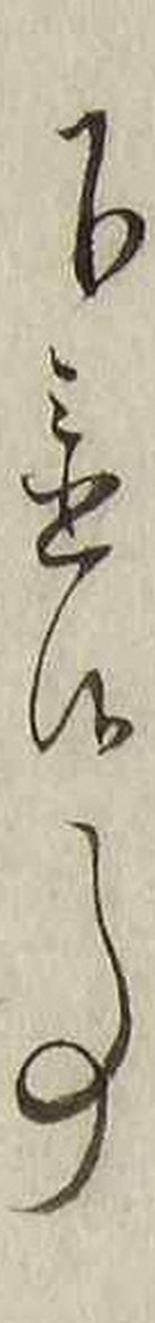下置候事
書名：諸士系譜　巻之8　い之部8
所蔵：会津若松市立会津図書館
